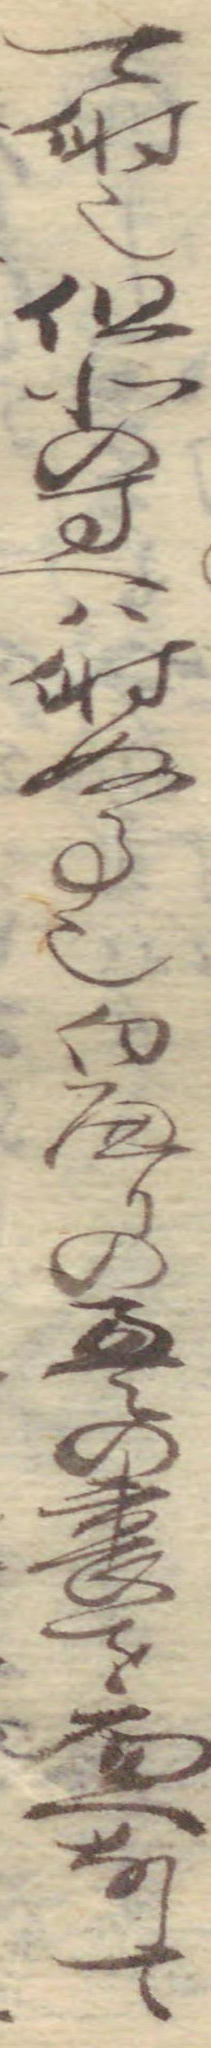可射也但北の方へハ射ぬ事なり也し白へりの畳の裏を西へなして
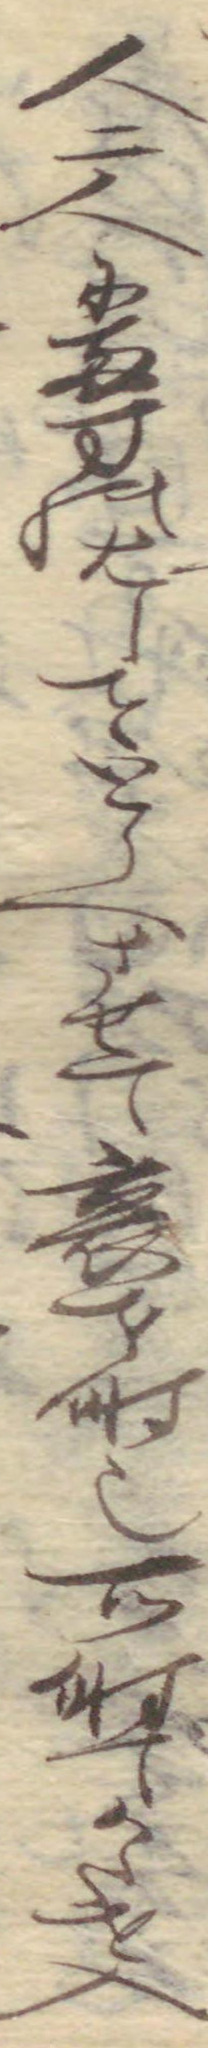人二人に両方の端をとらへさせて裏を射也一ツ射てかたを入
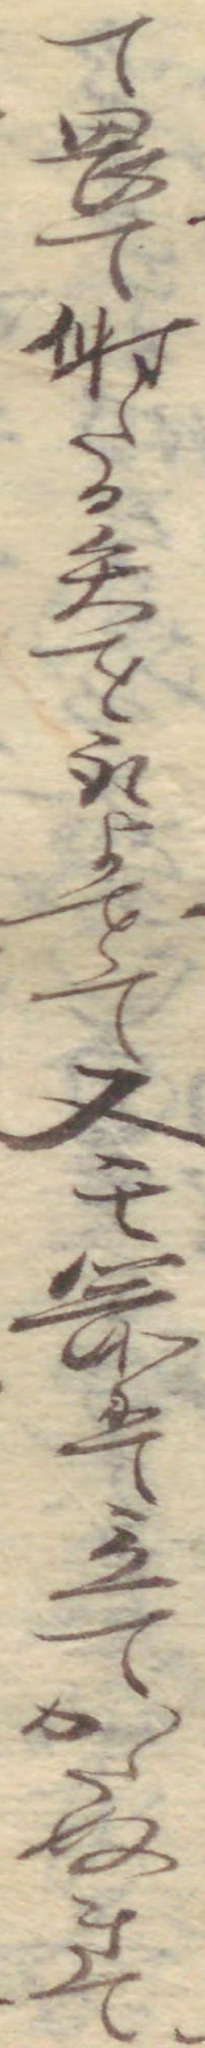て畏て射たる矢を取よせて又其箭にて立てかたぬきて
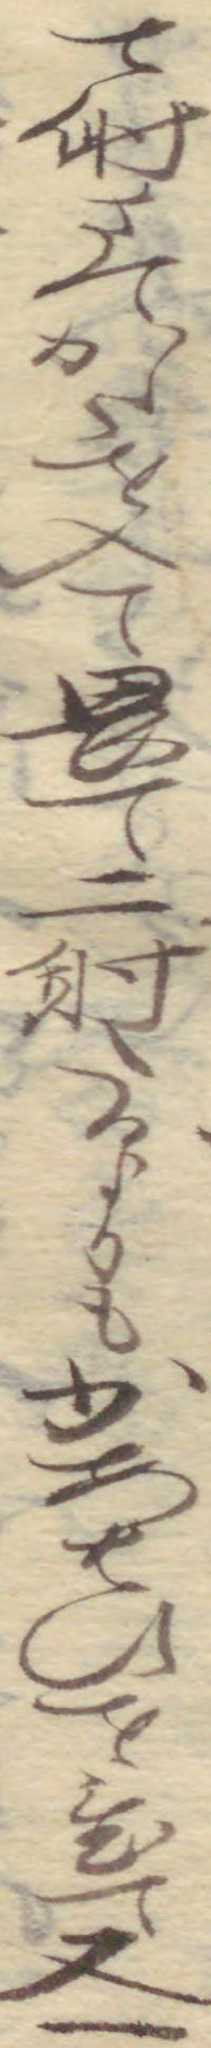可射さてかたを入て畏て二射たるよりも少あはひを置て又一
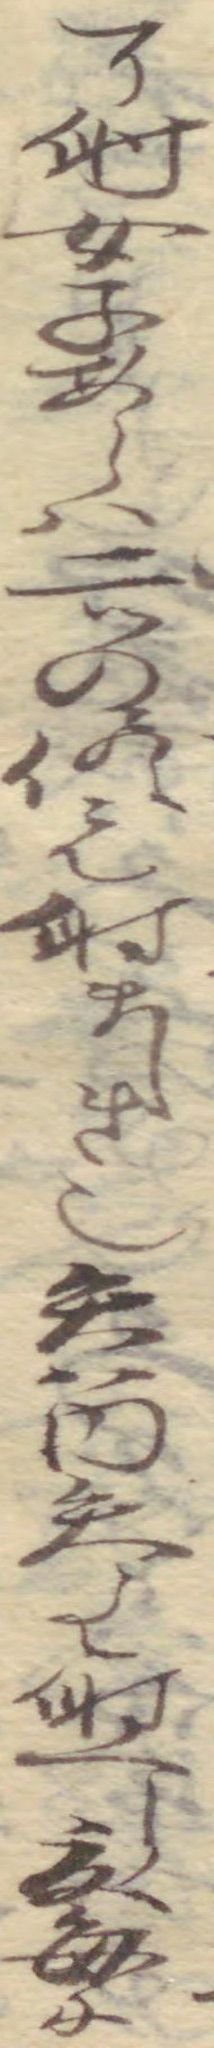可射女子ならは二ツの儘ニて射ましき也矢ハ内矢にて射へし度毎に
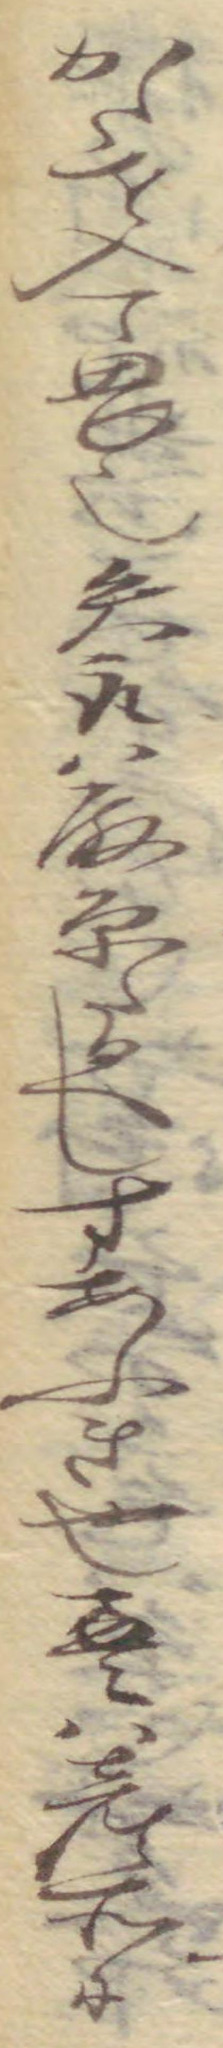かたを入て畏也矢取ハ殿原たるへしすあふき也畳ハ産所に
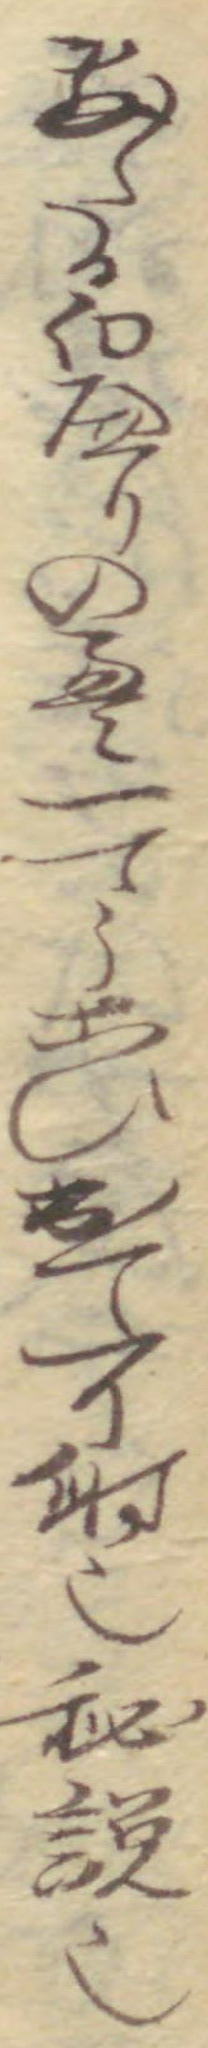敷たる白へりの畳一てうこひ出て可射也秘説也
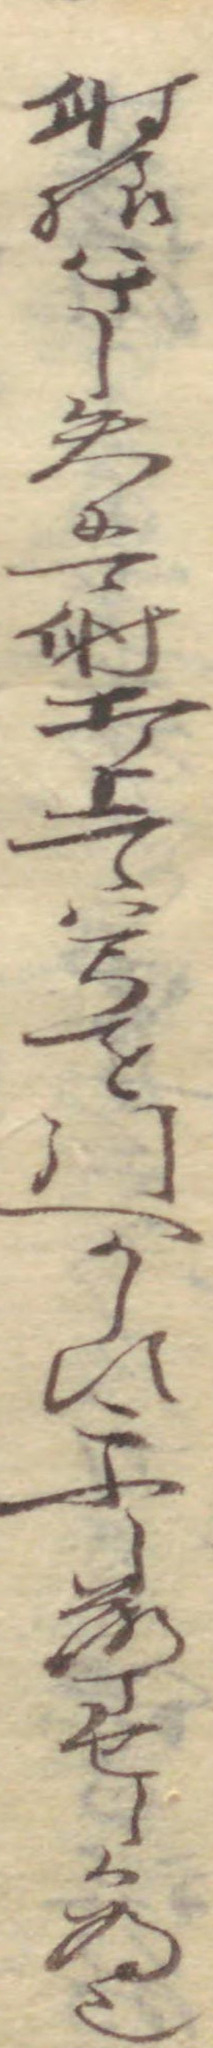一射様ハさし矢に可射打上てハ弓を引へからすこふし落させしか為なり
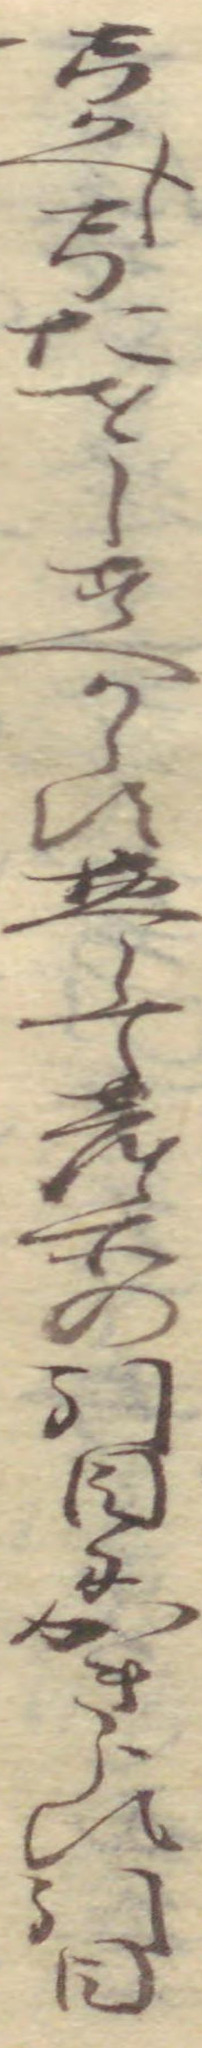弓かへし弓たをしすへからす惣して産所の引目にかきらす引目
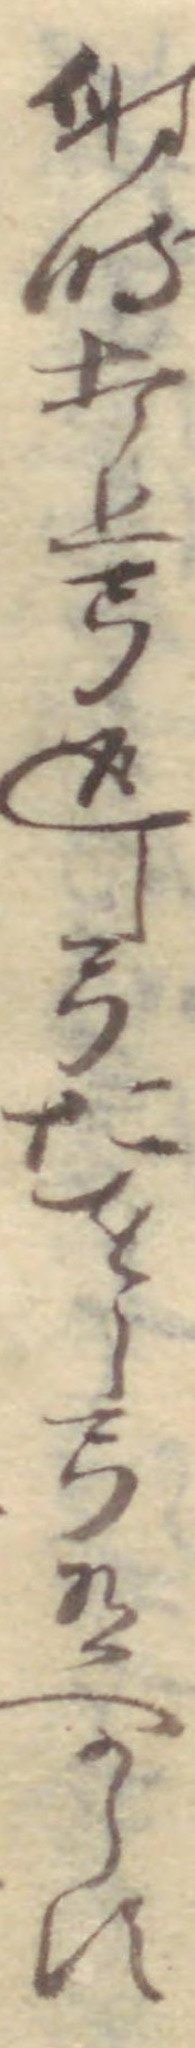射時打上弓返し弓たをし弓有へからす
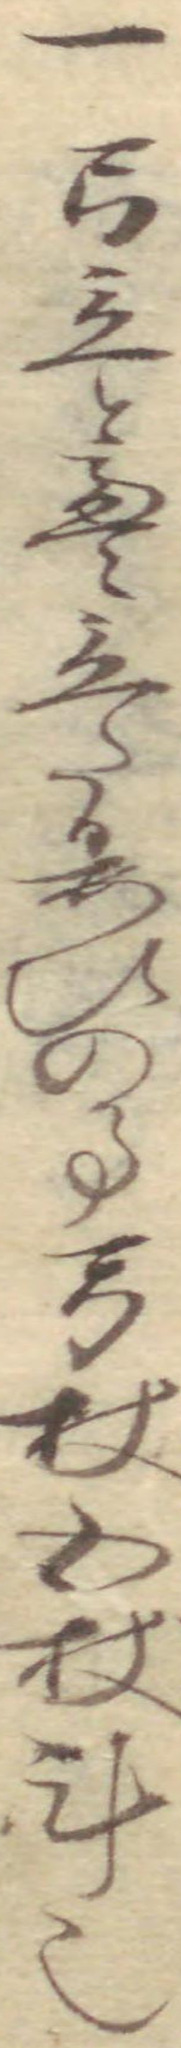一弓立と畳立たるあひの事弓杖五杖斗也
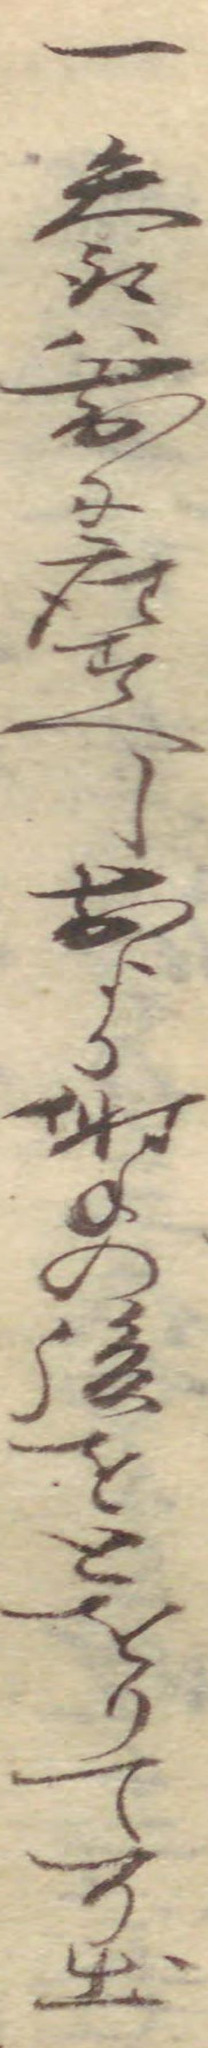一矢取は前に座すへし前より射手の後をとをりて可出
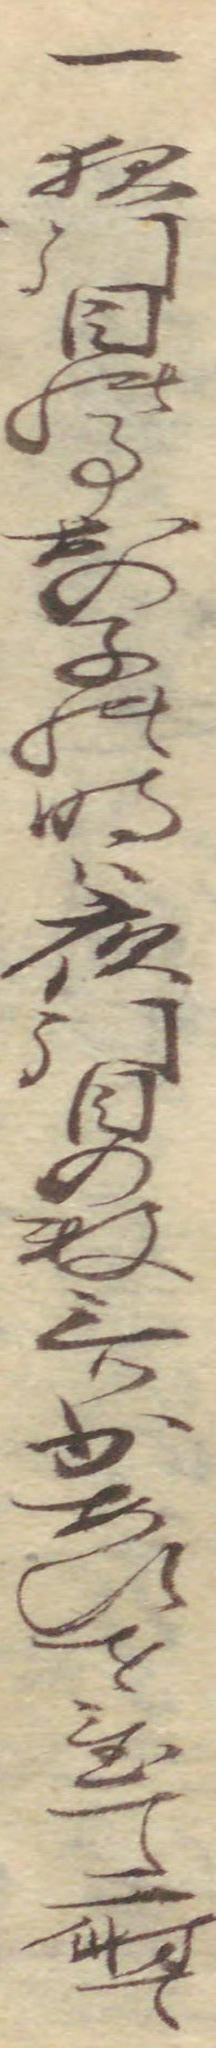一夜引目の事おの子の時ハ夜引目の数三ツ少あひを置て二射て
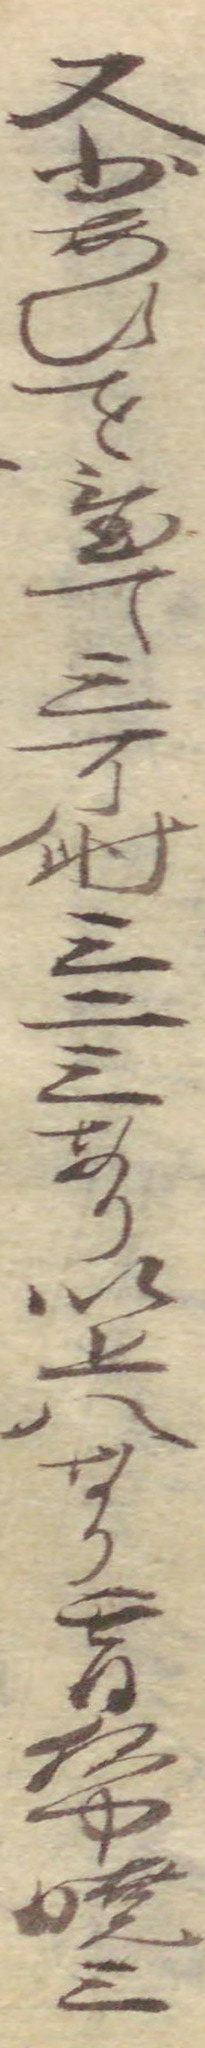又少あひを置て三可射三二三なり以上八なり宵夜中暁三
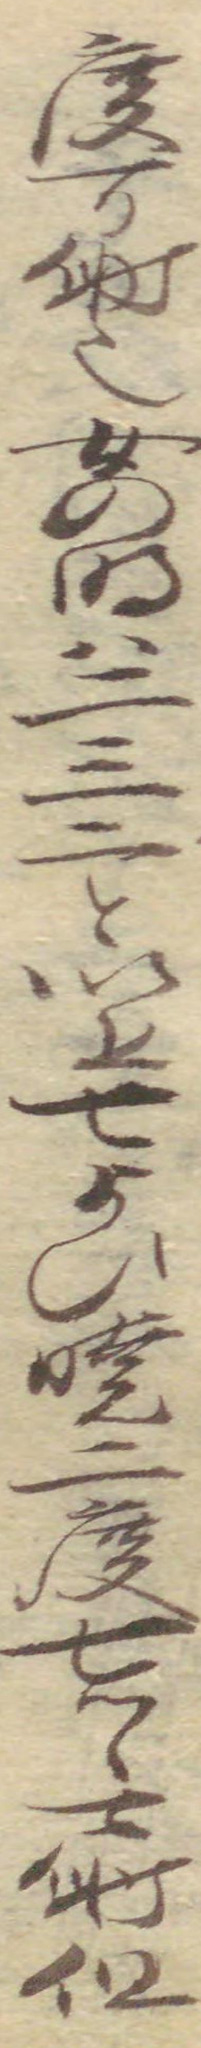度可射也女の時ハ二三二と以上七よひ暁二度七ツゝ可射但
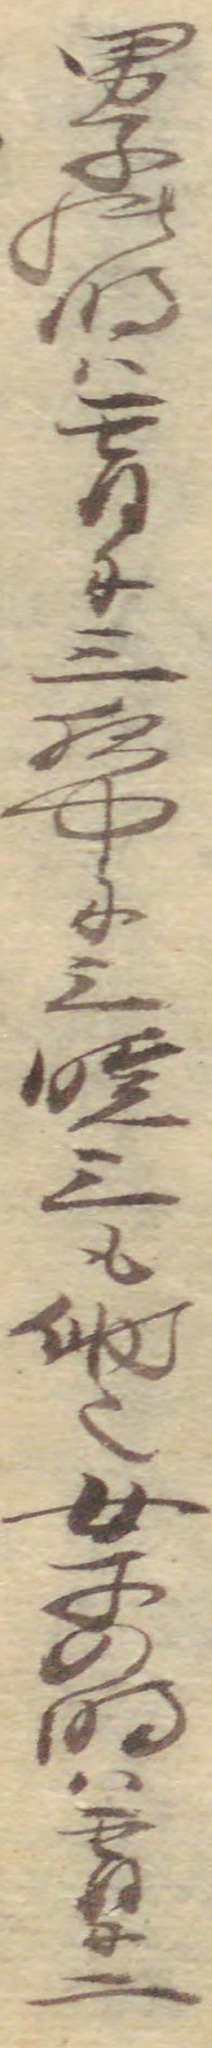男子の時ハ宵に三夜中に三暁三も射也女子の時ハ宵に二
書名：鶯宿雑記. 巻199-200
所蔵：国立国会図書館 National Diet Library, JAPAN
